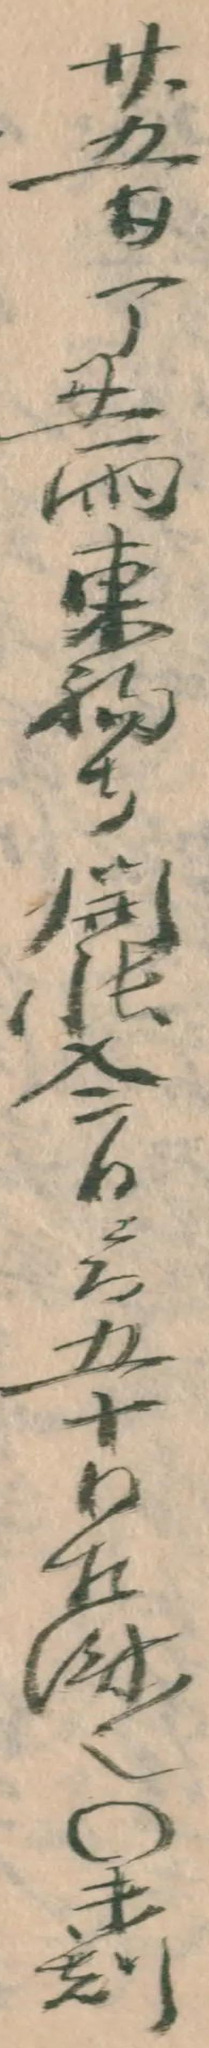廿五日丁丑雨東福寺開帳今日ニ而五十日相済也○未刻
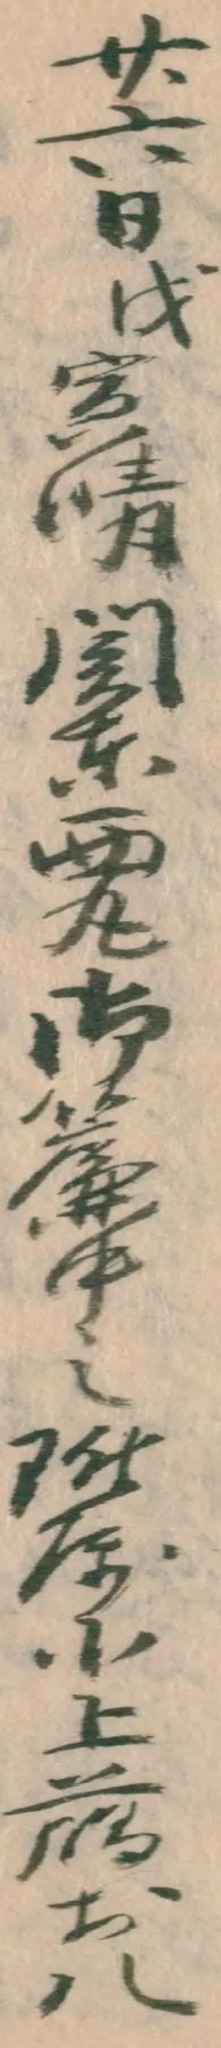廿六日戊寅晴関東西丸御簾中之附属小上臈お八
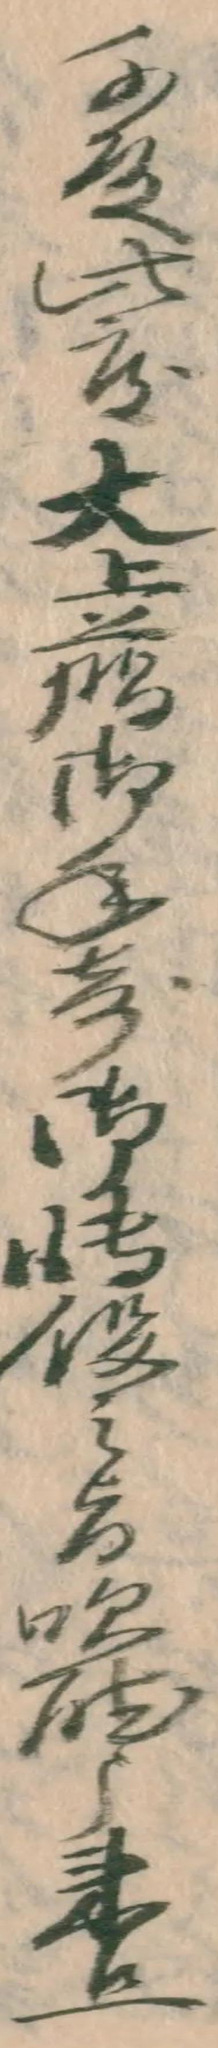千殿此度大上臈御年寄御轉役之旨吹聴申来且
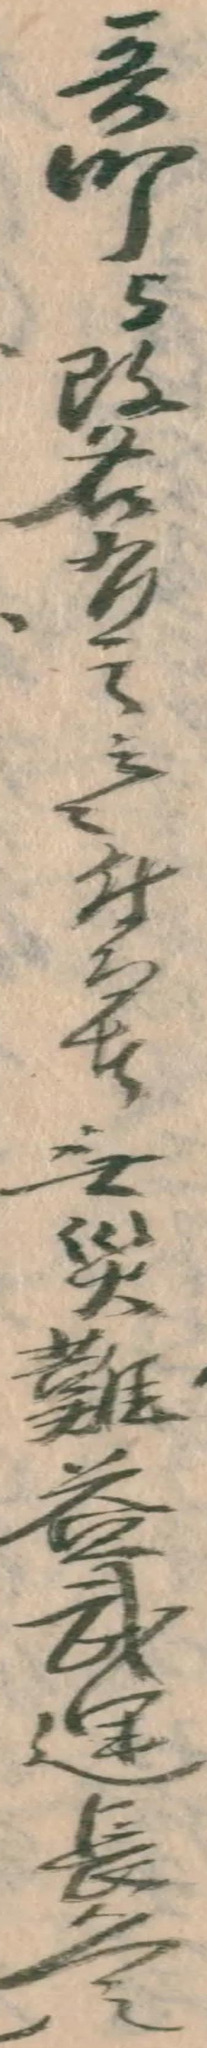歌町と改名有之云々付而は無災難益武運長久之
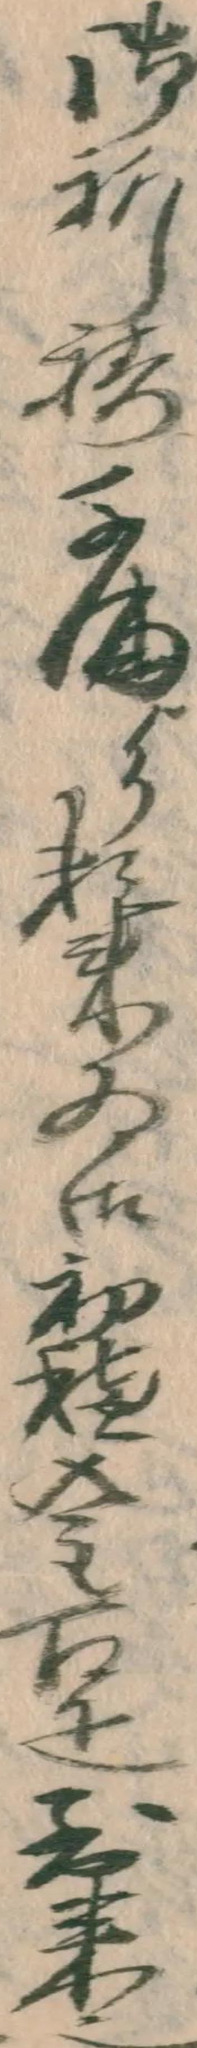御祈祷千浦より頼来為御初穂金百疋到来之
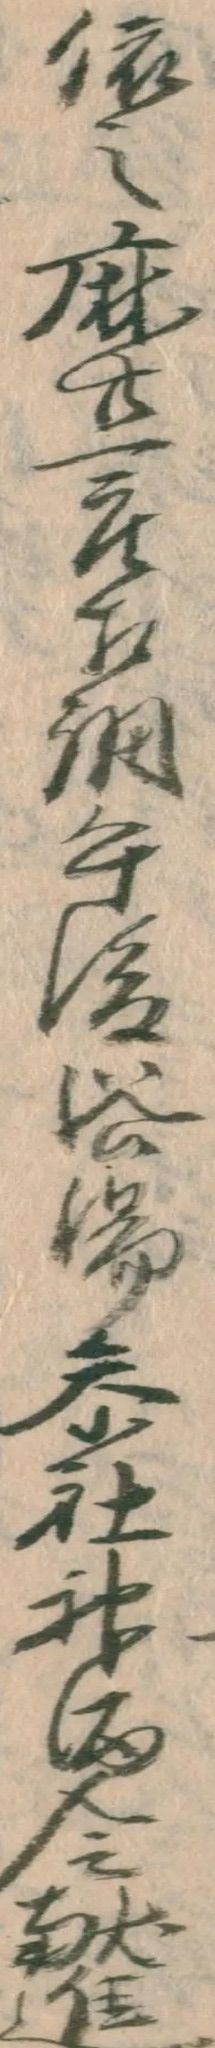依之麻廿一座相調午後浴場参社神酒金献進
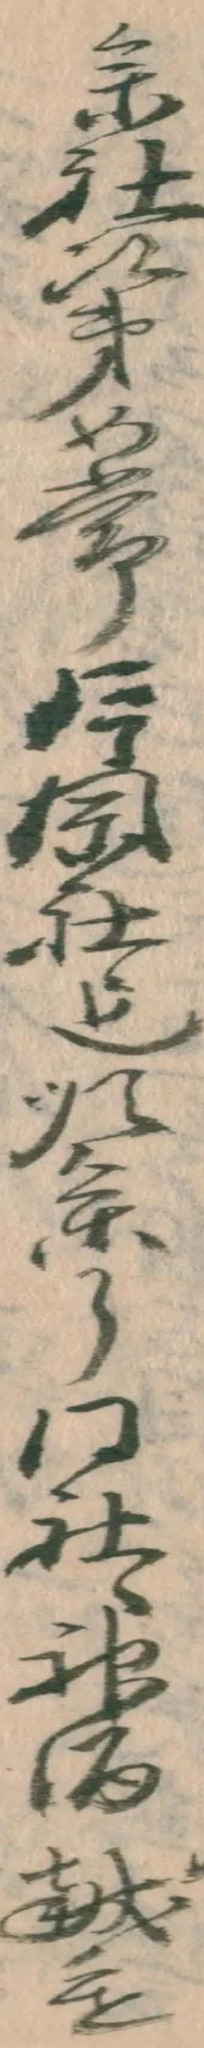参社次第如常片岡社追順参了同社へ神酒献進
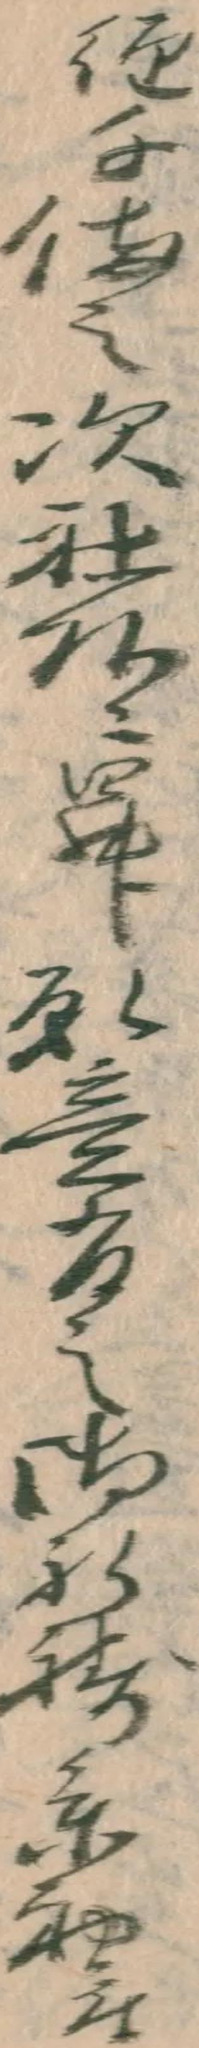経千備之次社頭ニ昇候願意有之御祈祷参勤ニ付
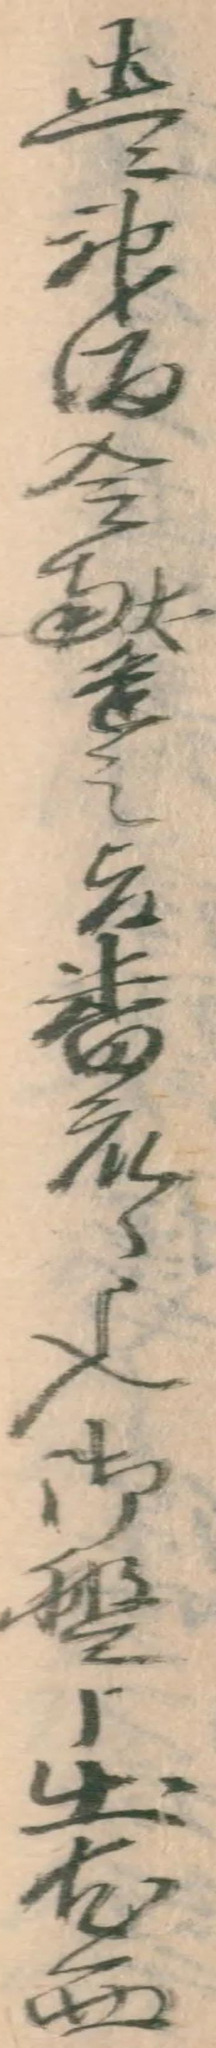直ニ神酒令献進之旨番衆へ申入御整申出尤西
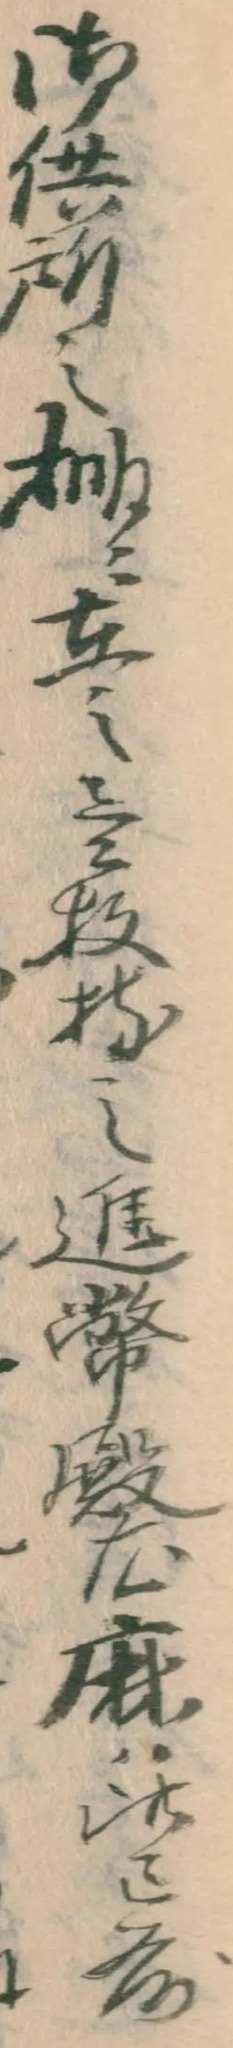御供所之棚に在之壱枚持之進幣殿屋麻ハ此已前
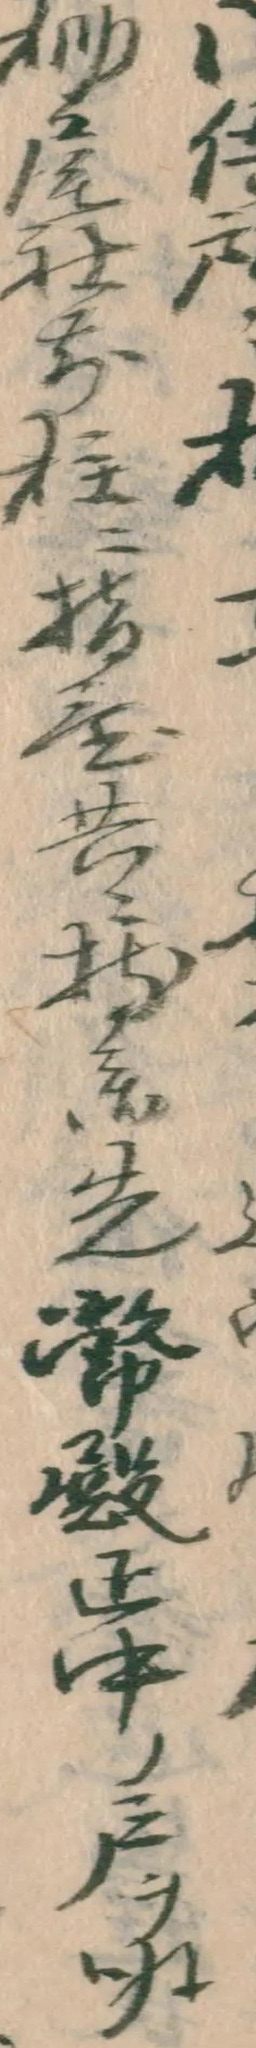棚尾社前柱ニ指置共ニ持参先幣殿正中ノ戸ヲ明
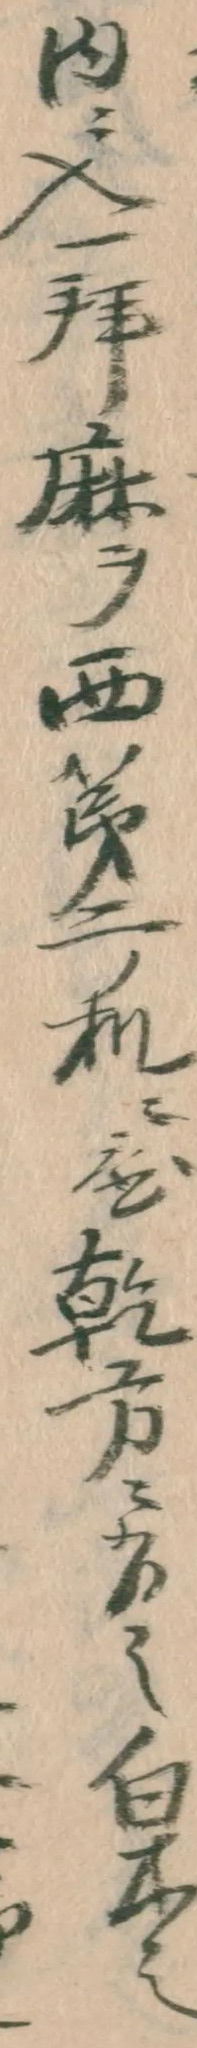内に入一拝麻ヲ西第二ノ机ニ置乾方ニ有之白木之
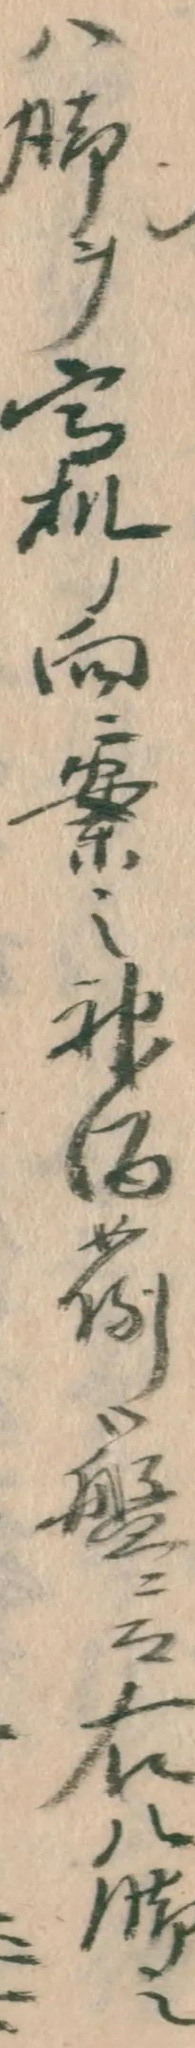ハ脚ヲ高机ノ向ニ案之神酒如例御盤ニ而右八脚之
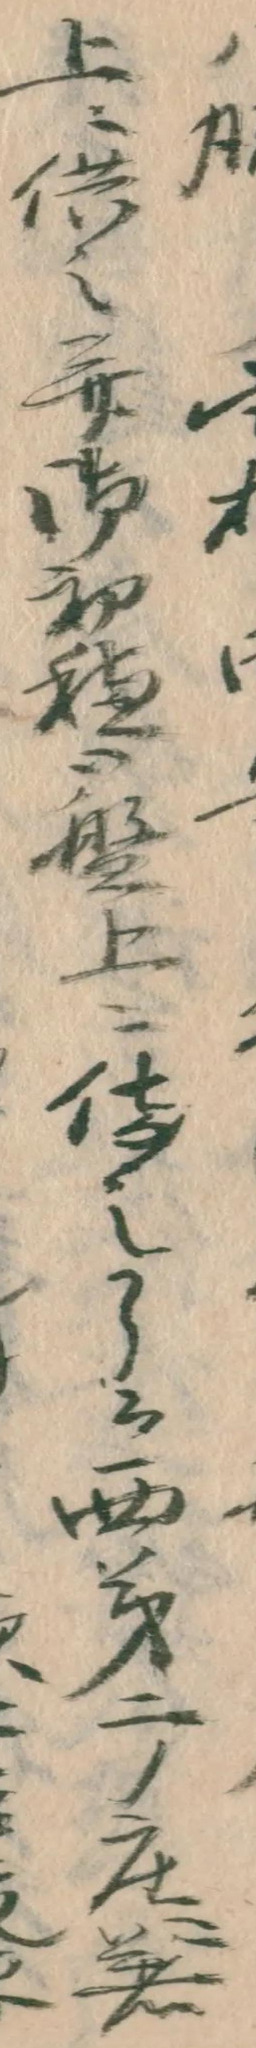上ニ供之幷御初穂御盤上ニ備之了而西第二ノ座ニ着
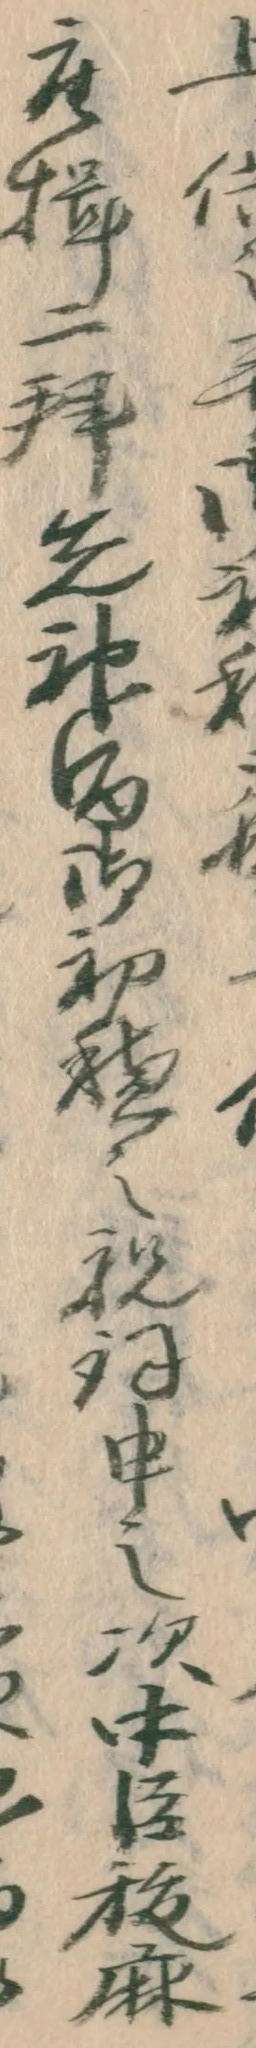座揖二拝先神酒御初穂之祝詞申之次中臣抜麻
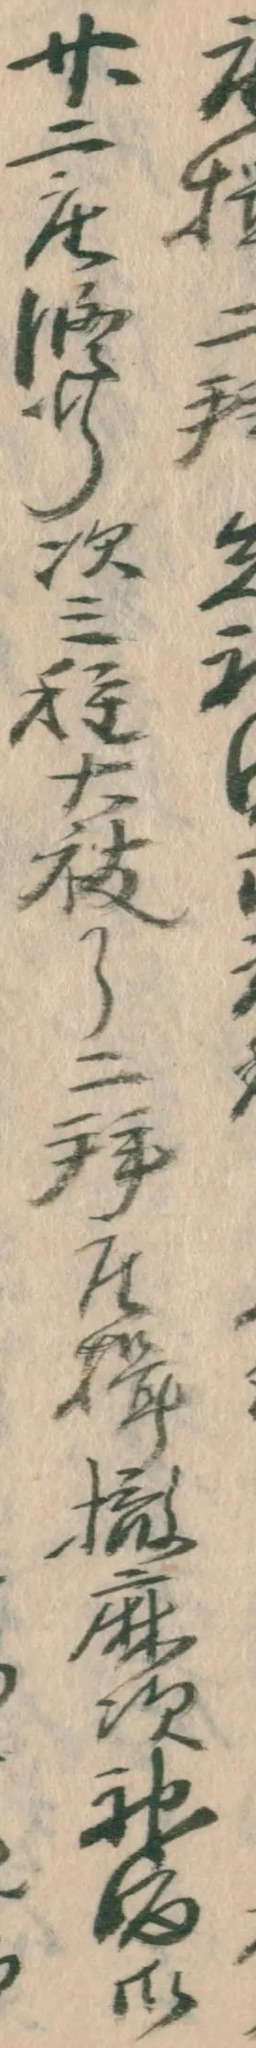廿二座修行次三種大祓了二拝座揖撒麻次神酒御
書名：賀茂社記録. 第67冊
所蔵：国立国会図書館 National Diet Library, JAPAN
